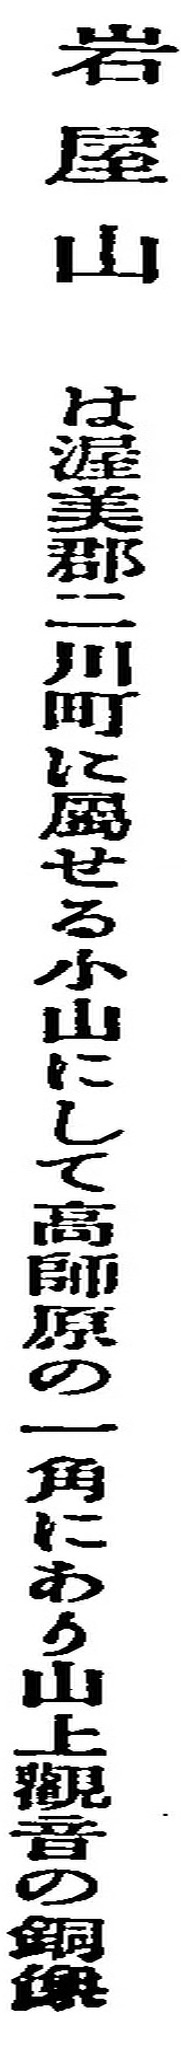岩屋山は渥美郡二川町に屬せる小山にして高師原の一角にあり山上觀音の銅像
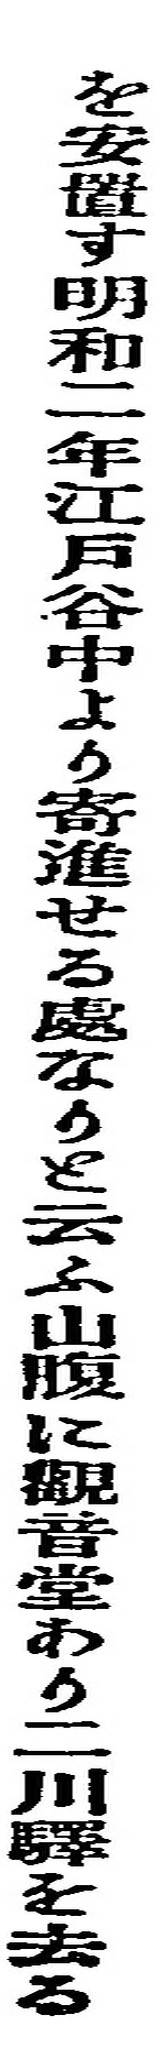を安置す明和二年江戸谷中より寄進せる處なりと云ふ山腹に觀音堂あり二川驛を去る
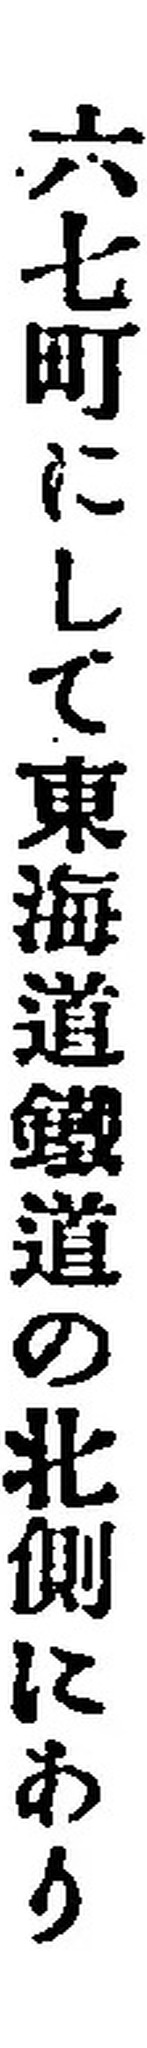六七町にして東海道鐵道の北側にあり

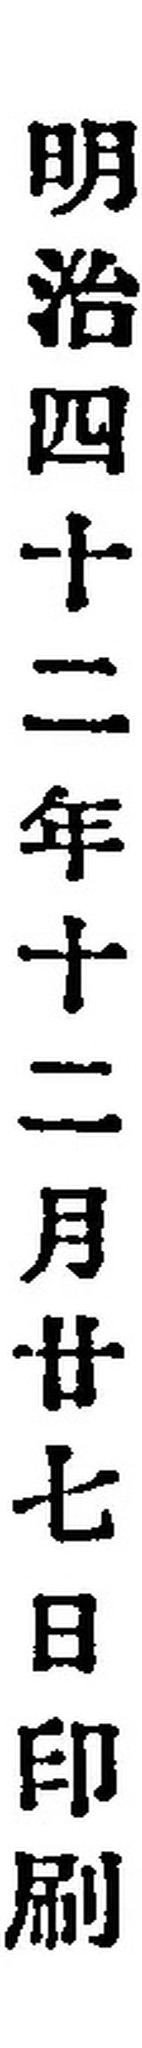明治四十二年十二月廿七日印刷
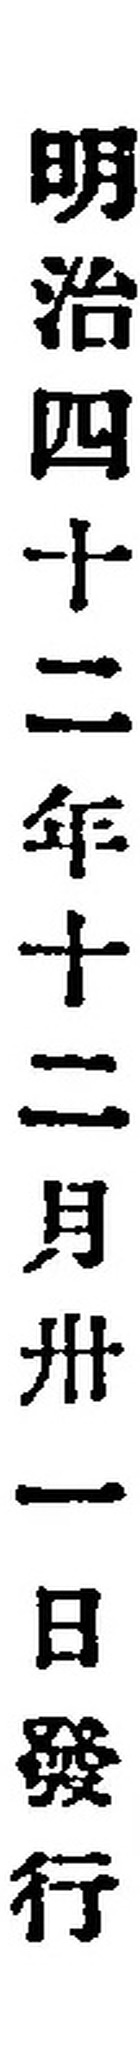明治四十二年十二月卅一日發行
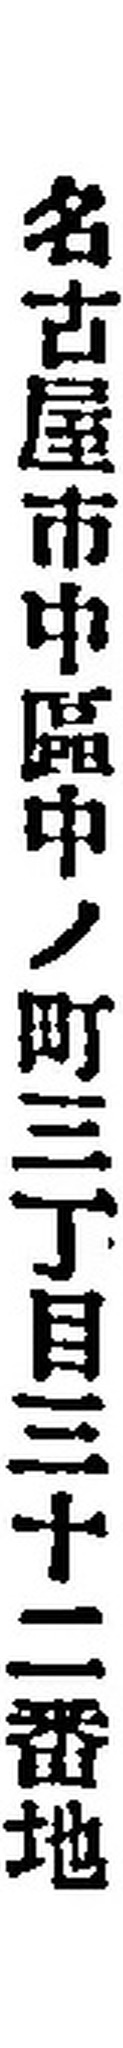名古屋市中區中ノ町三丁目三十二番地
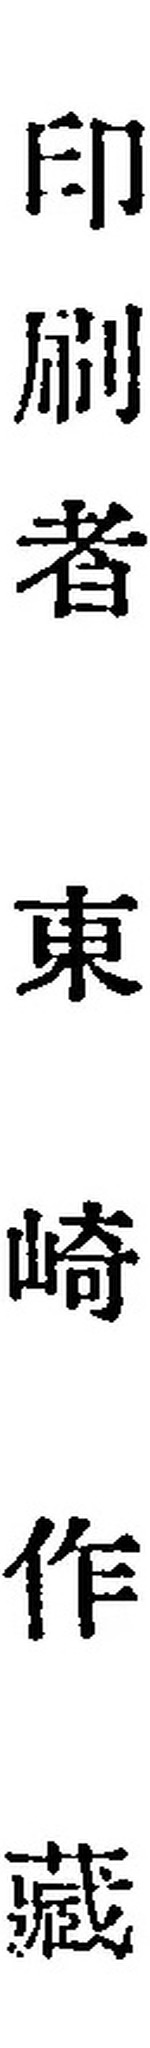印刷者東崎作藏
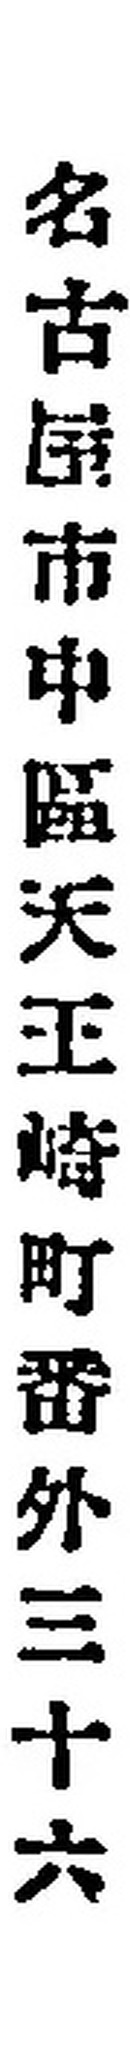名古屋市中區天王崎町番外三十六
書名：豊橋志要
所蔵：国立国会図書館 National Diet Library, JAPAN
